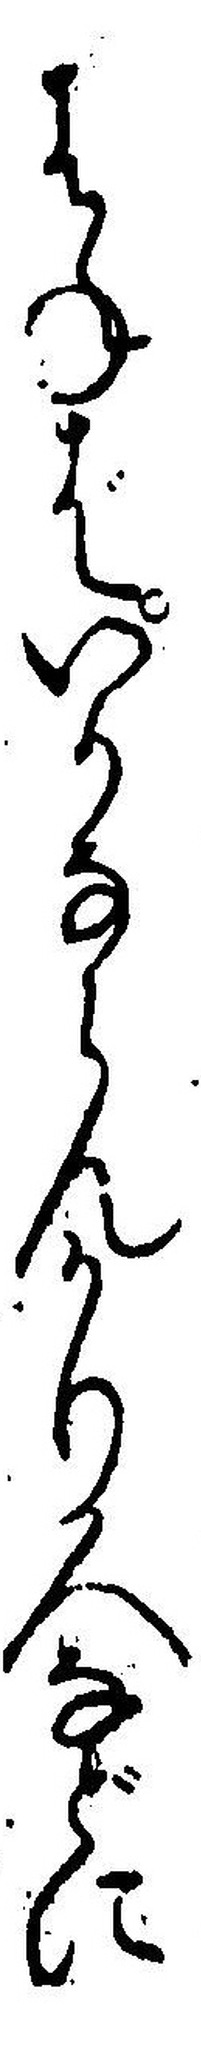はねば。いかならんかり人などに
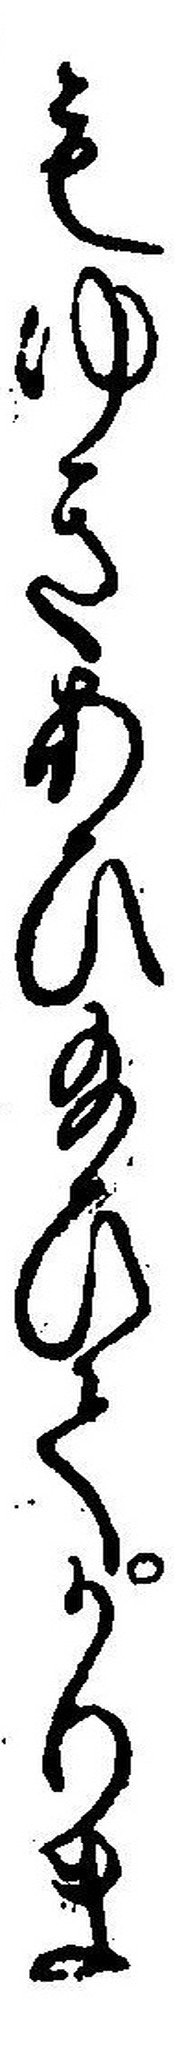もゆきあひ給ひて。かりま
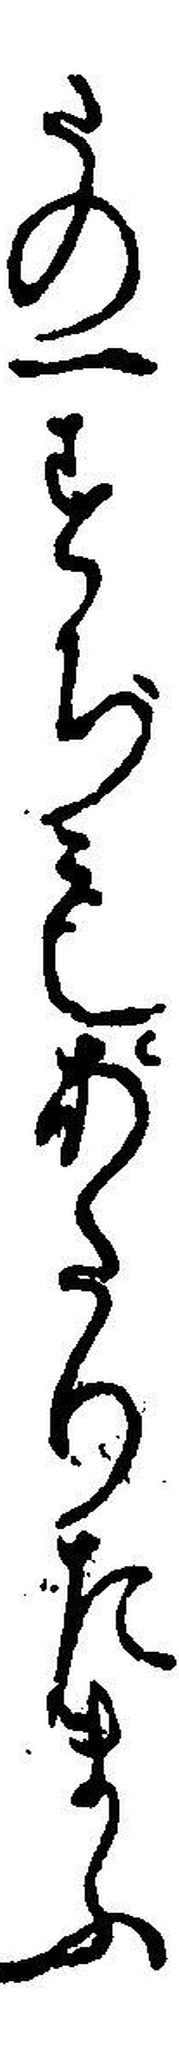たの一すぢも。あたりたまふ
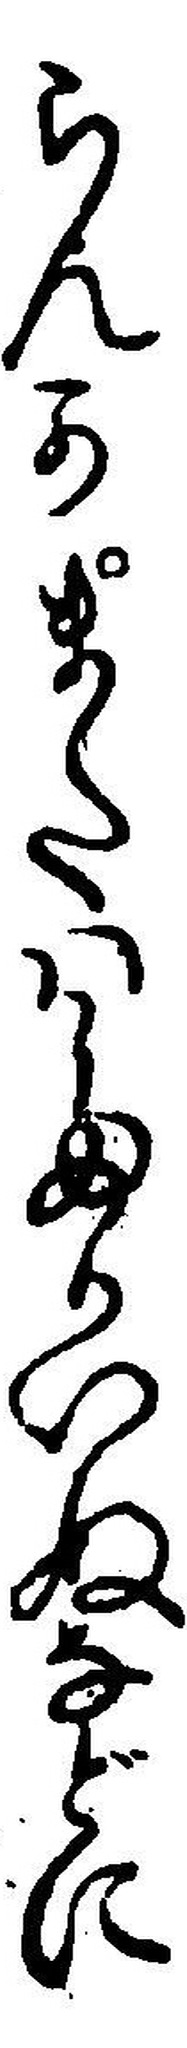らんか。またはたかいぬなどに
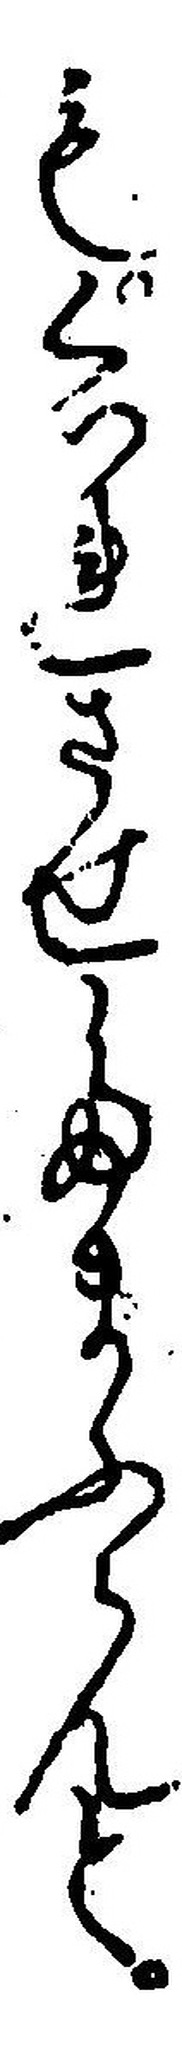も。くはれさせたまふらんと。
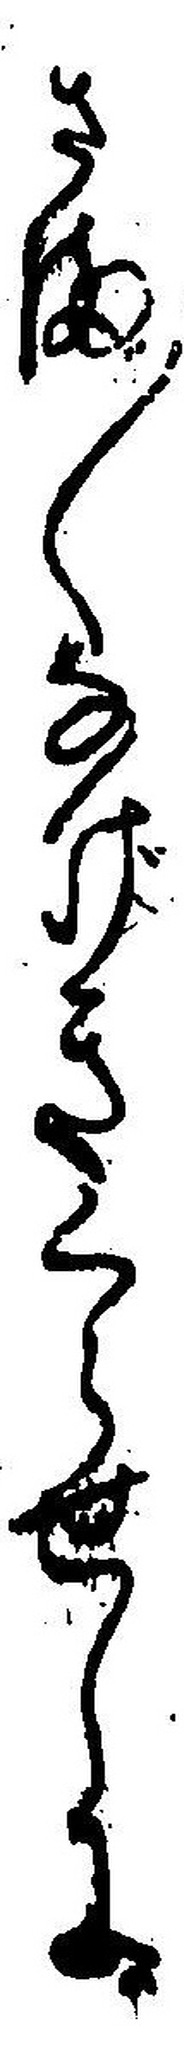さま〳〵なげきくらせしに。
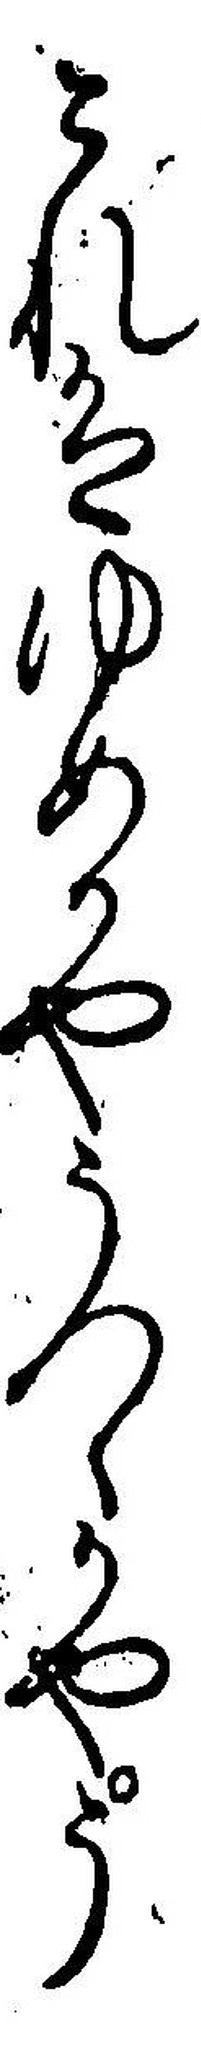これはゆめかやうつゝかや。う
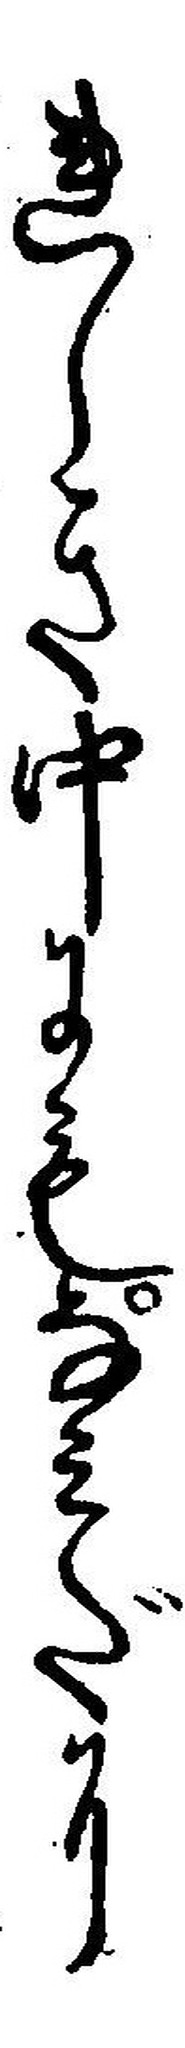れしき中にも。なみだに
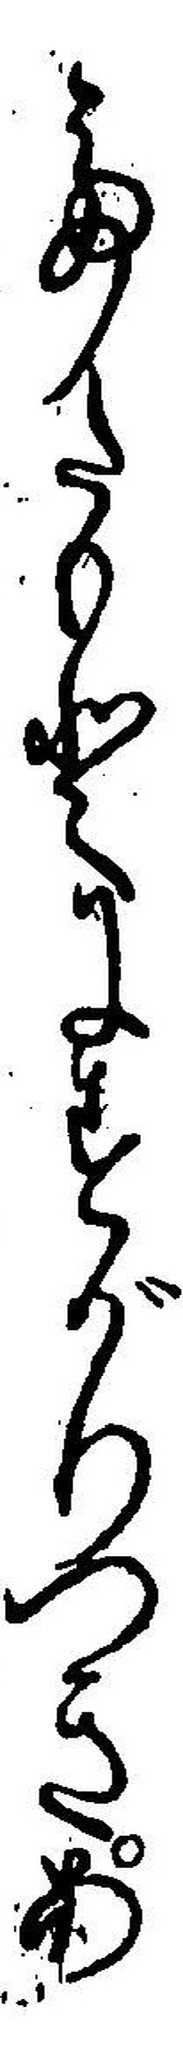てたもとにすがりつき。あ
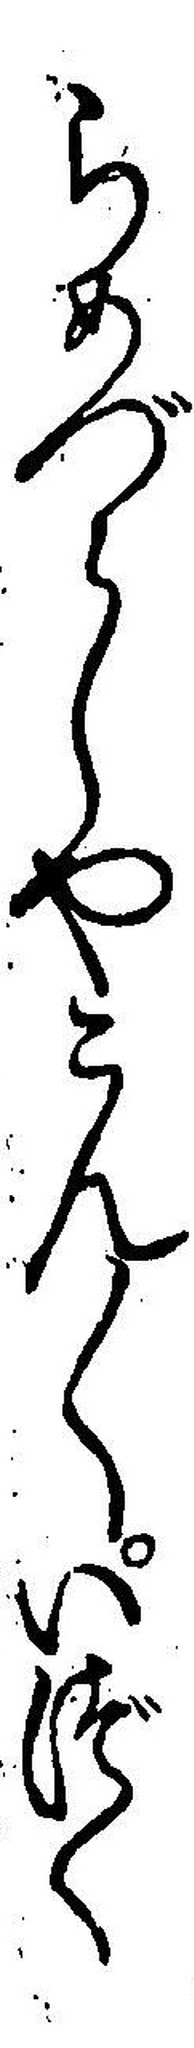らめづらしやこん〳〵。いづく
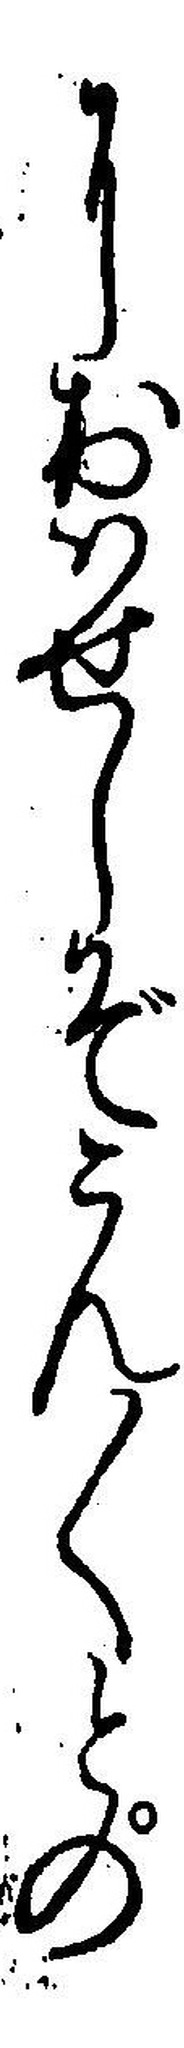におはせしぞこん〳〵と。の
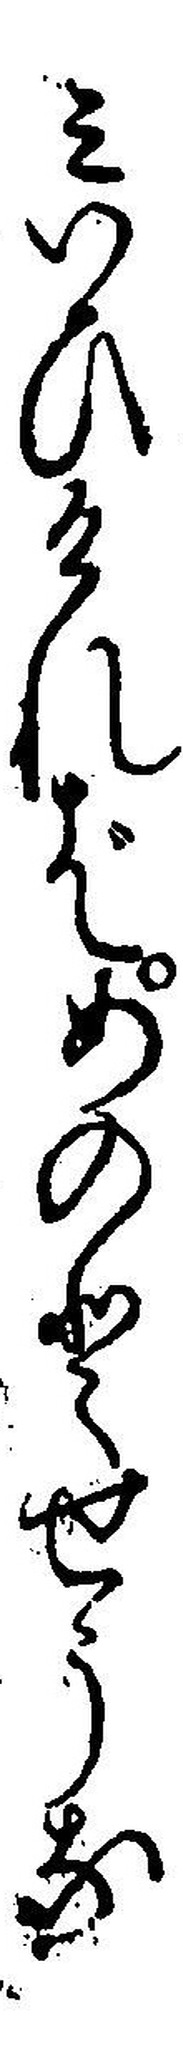みいひければ。めのとせうな
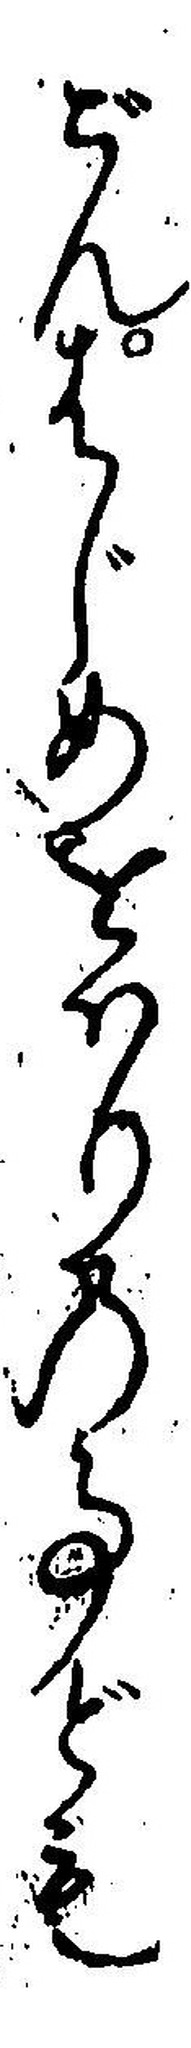ごん。はじめをはりの事ども
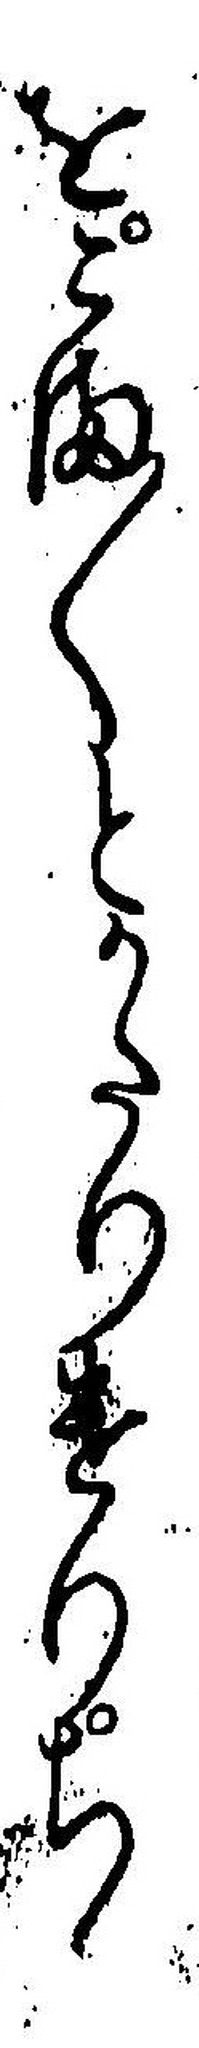を。こま〳〵とかたりけり。ちゝ
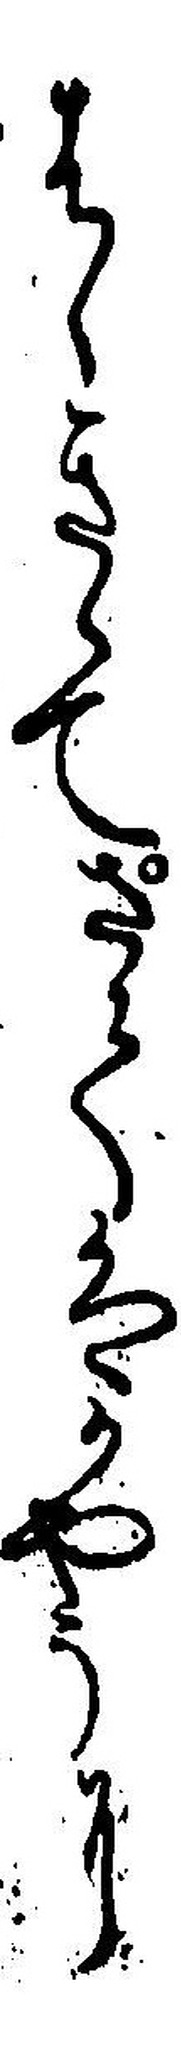はゝきゝて。さてはかやうに
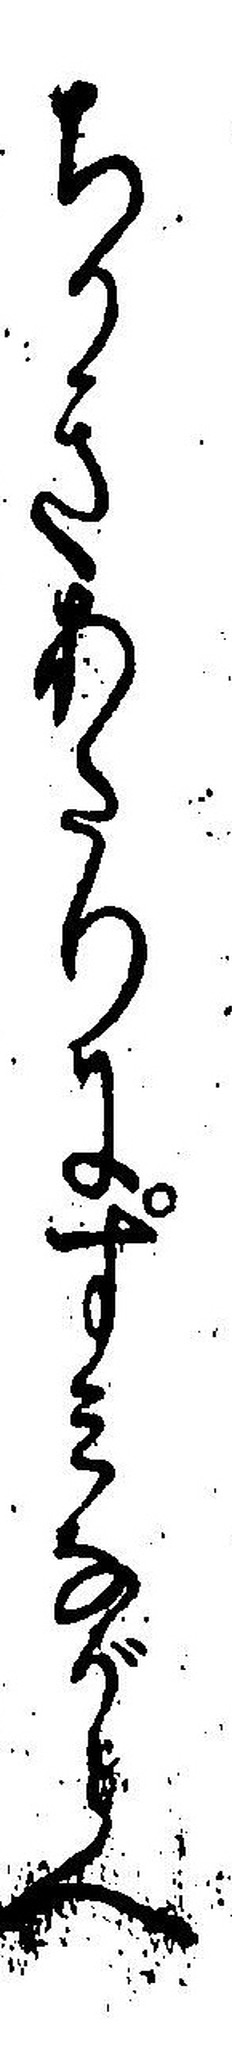ちかきあたりに。すみながらへ
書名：木幡きつね
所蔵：東京大学総合図書館 General Library in the University of Tokyo, JAPAN
